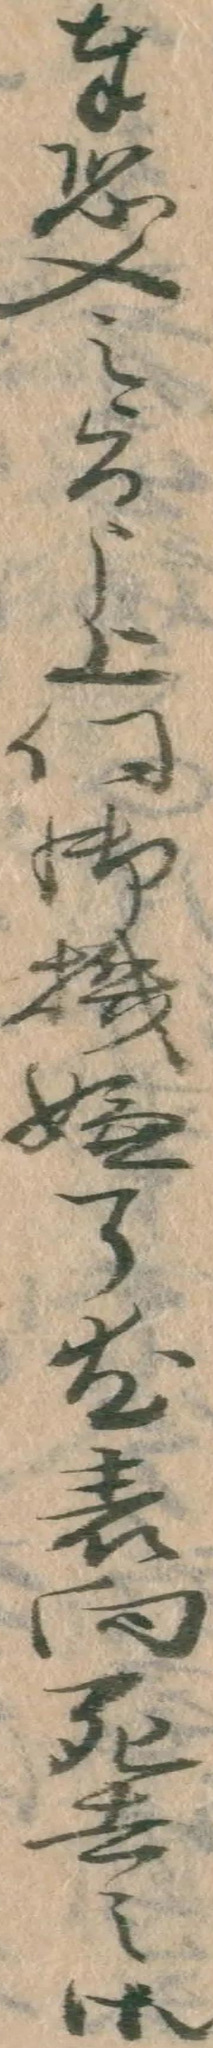奉恐入之旨申上、伺御機嫌了、尤表向死去之御
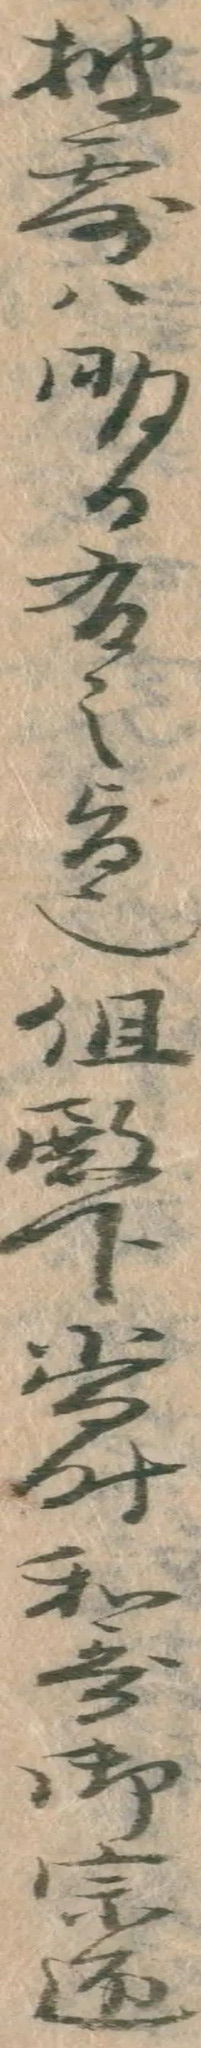披露ハ明日有之旨也、但殿下當時和歌御宗適
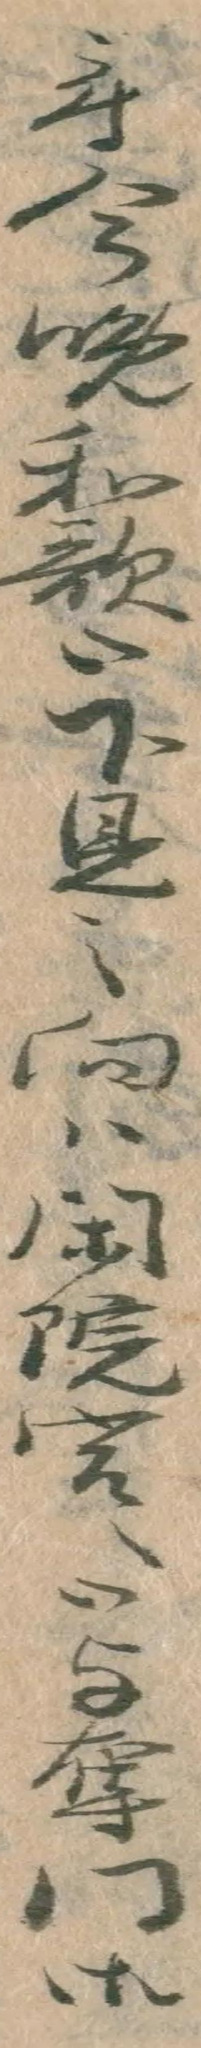ニ付、今晩和歌御下見之向ハ閑院宮へ御与奪、同御
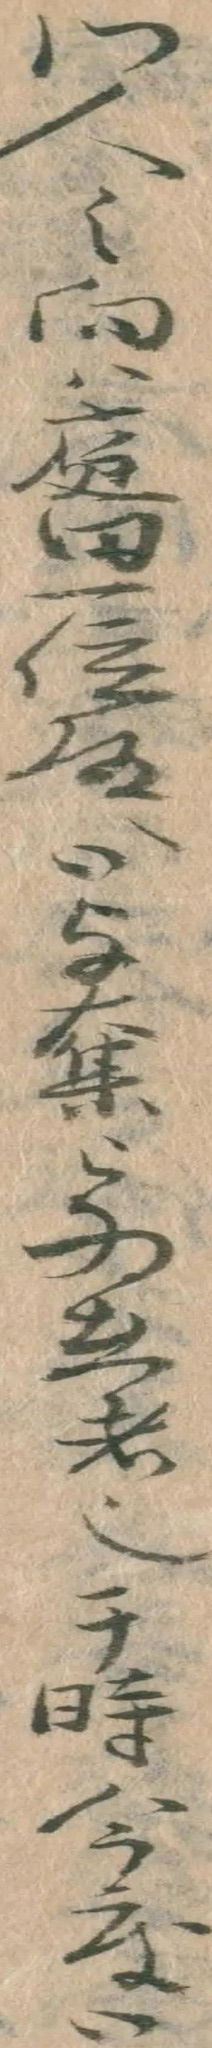同人之向は庭田一位殿へ御与奪被為在者也、于時今度御
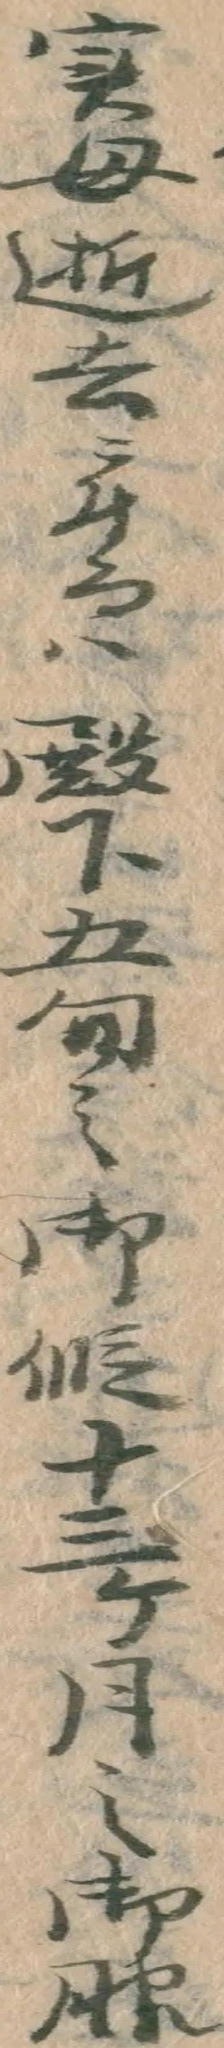実母逝去ニ付而ハ、殿下五旬之御假十三ケ月之御服、
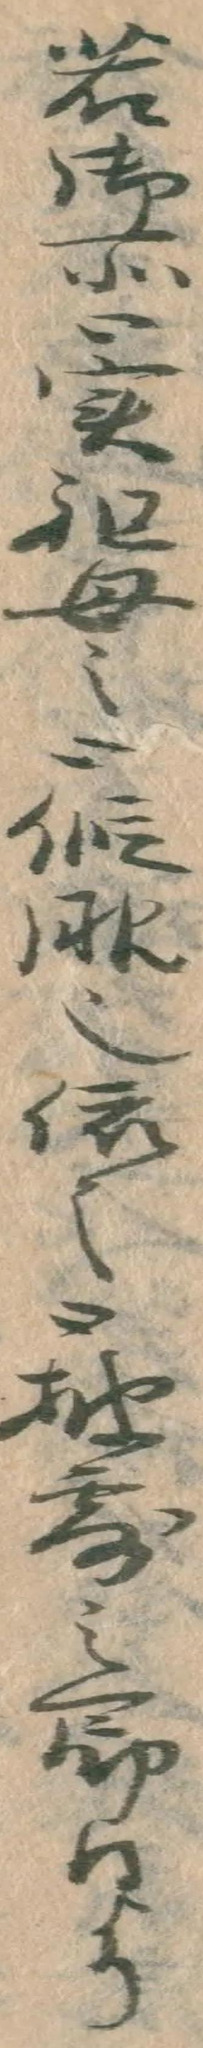若御所御実祖母之御假服也、依之御披露之節自より
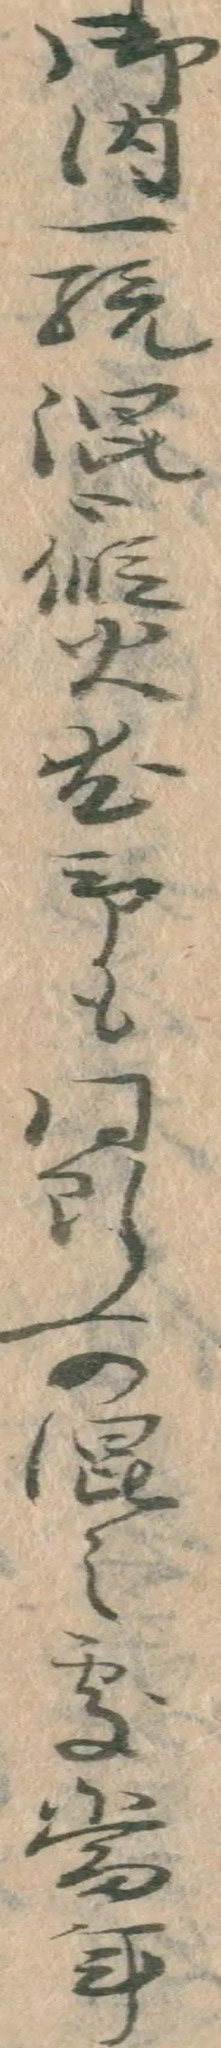御内一統混御假火、尤予も同断可混之處、當年
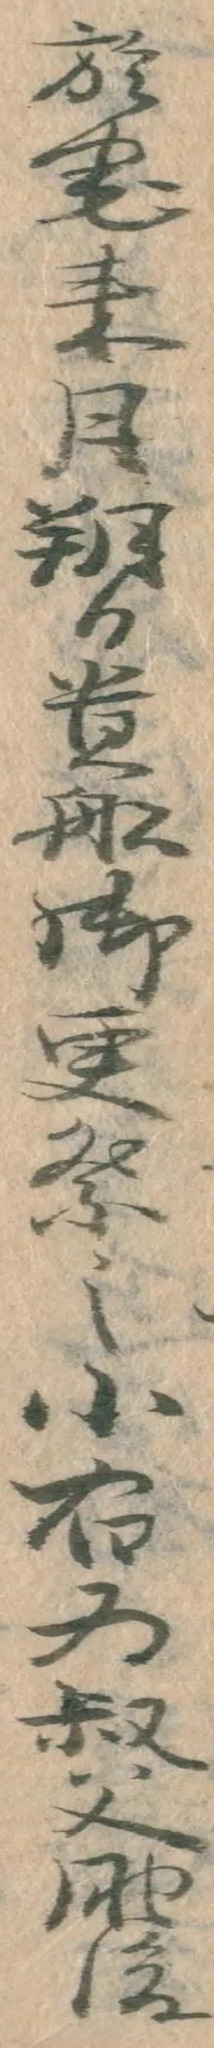於宅来月朔日貴船御更祭之小右為叔父肥後
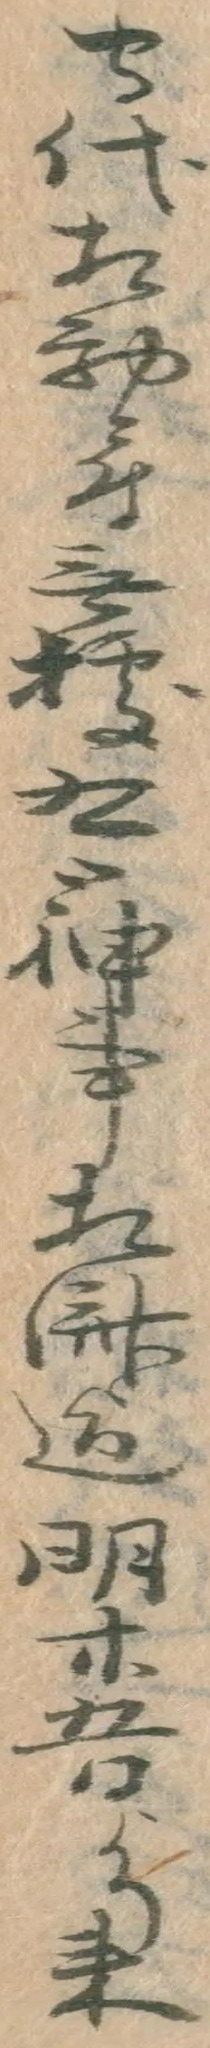守代相勤ニ付、無拠右御神事相済迄、明廿五日より来

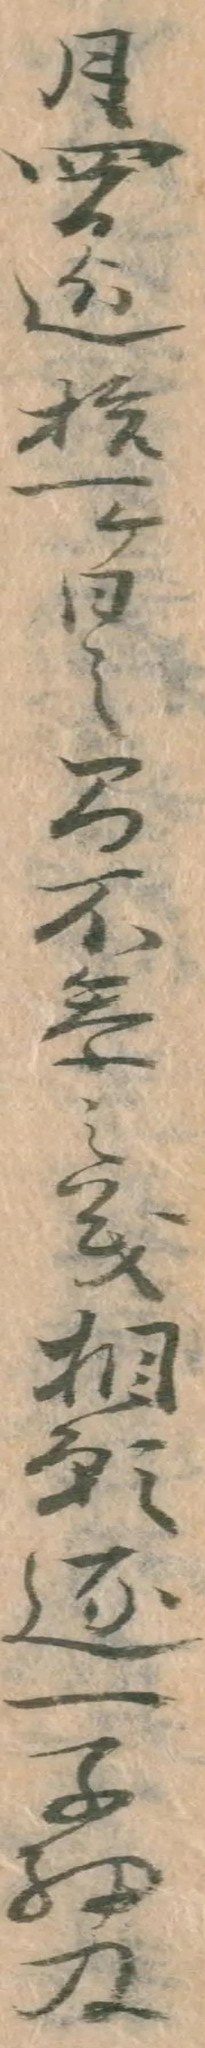月四日迄拾一ケ日之間不参之義相願、逐一子細及
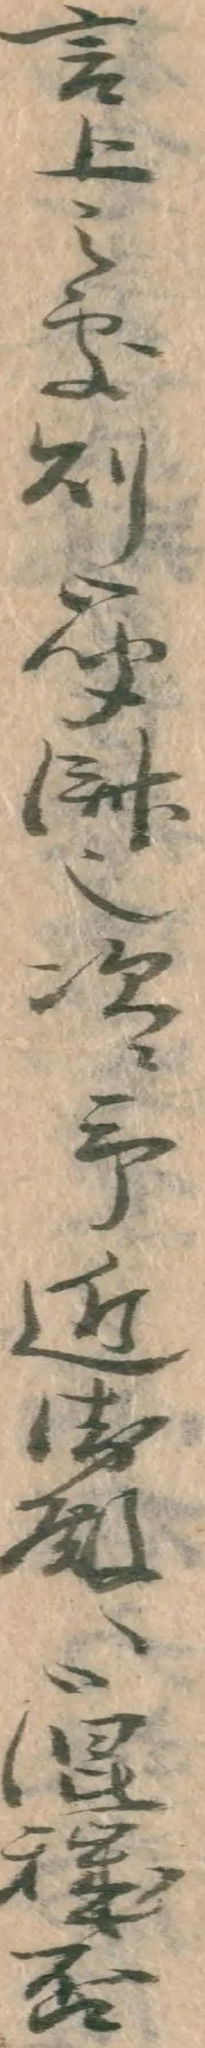言上之處、則御聞済也、次ニ予近衛殿へ御混穢否
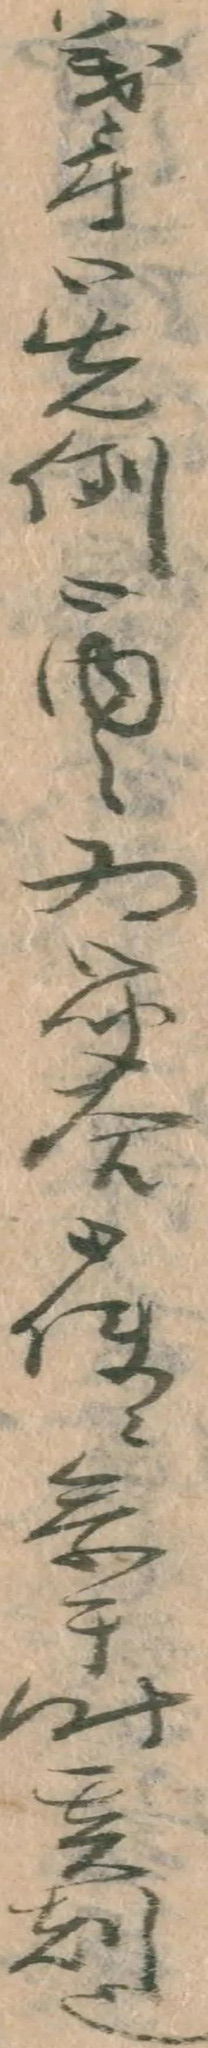義ニ付、御先例御内々為御聞答御使ニ参、于時亥刻也、
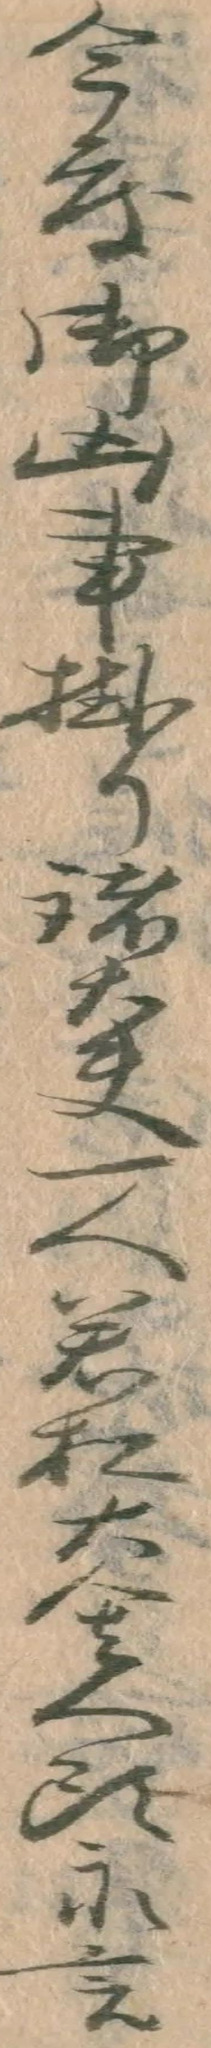今度御凶事掛リ、諸大夫一人若松大舎人頭永言・
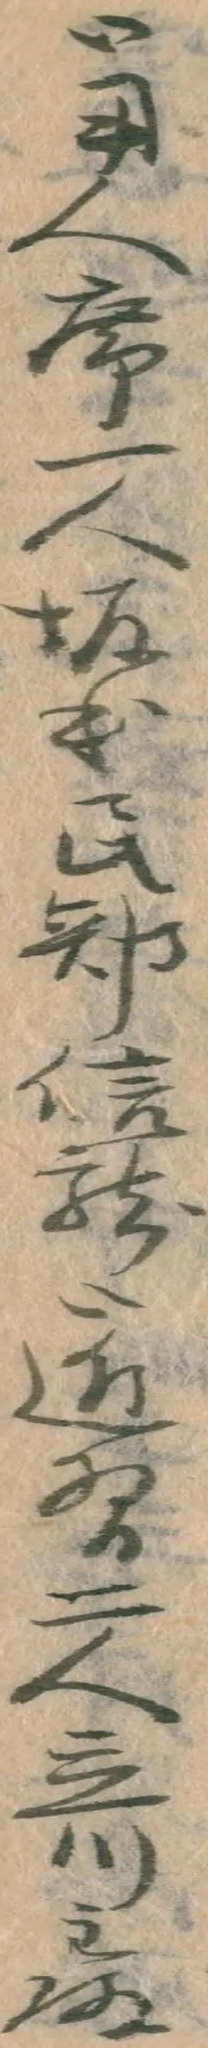御用人席一人坂本民部信龍・御近習二人立川主殿
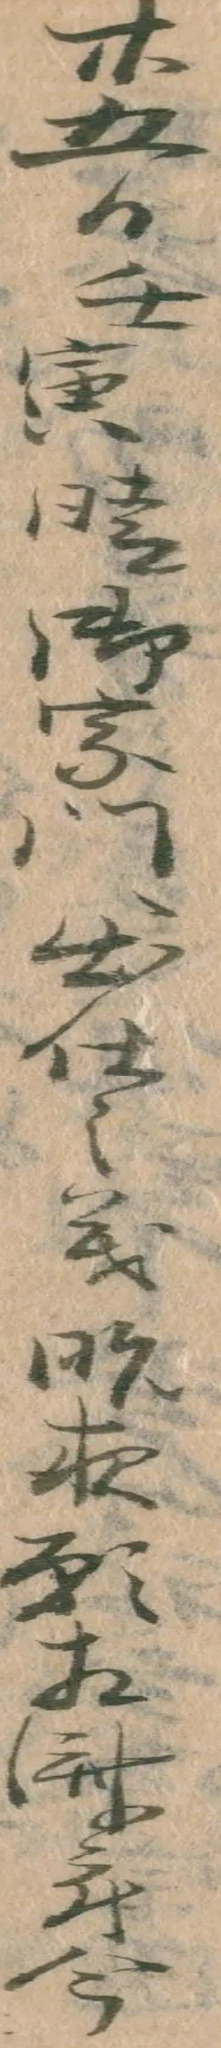廿五日壬寅晴、御家門へ出仕之義、昨夜願相済ニ付、今
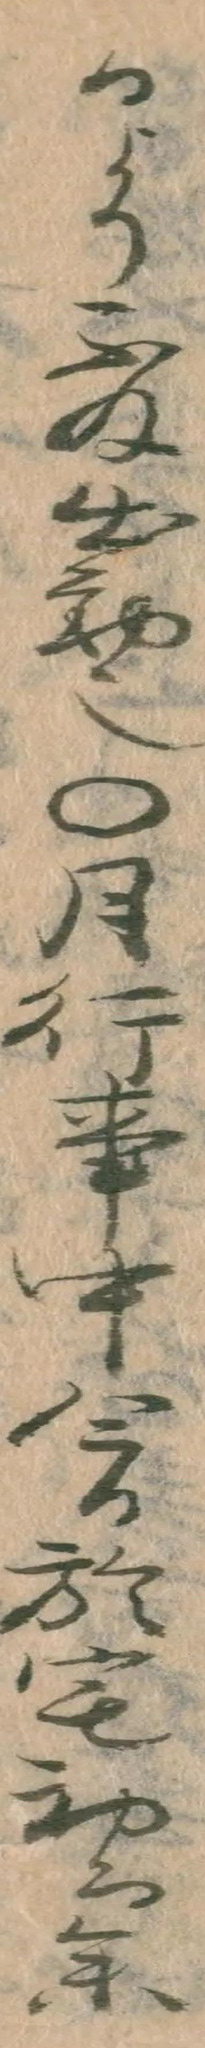日より不及出勤也、○月行事中、今日於宅初而参
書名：賀茂社記録. 第63冊
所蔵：国立国会図書館 National Diet Library, JAPAN
